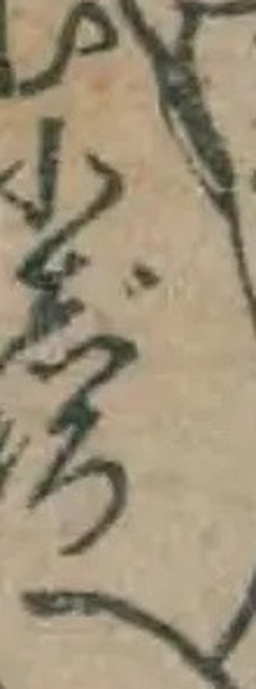む小じろ
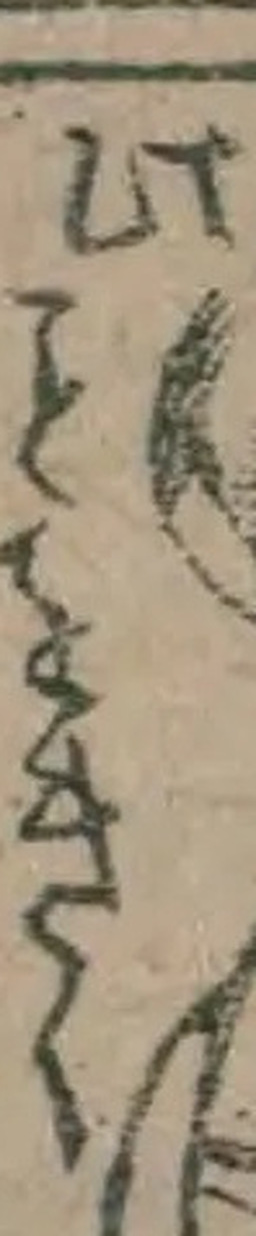此ことをきく
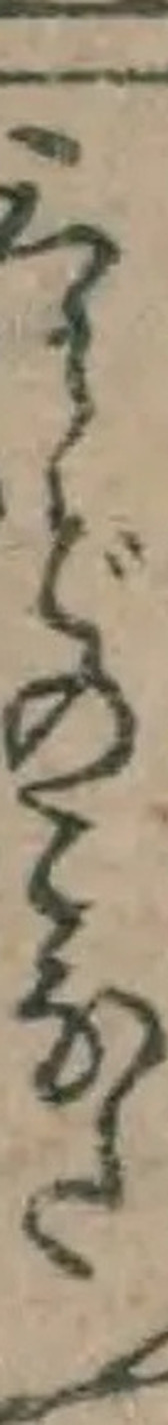三郎どのこなた
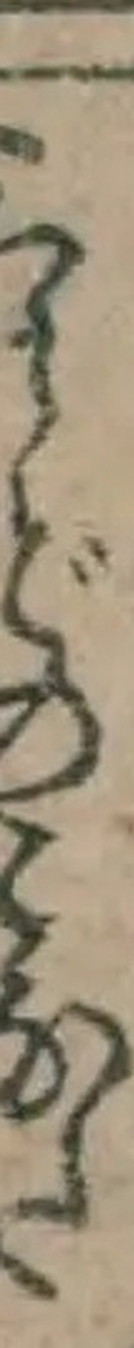三郎どのこなた
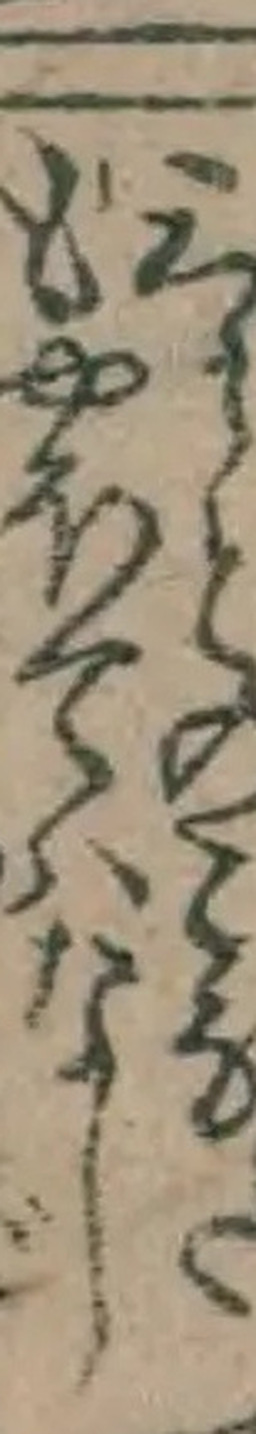もやほてはなし
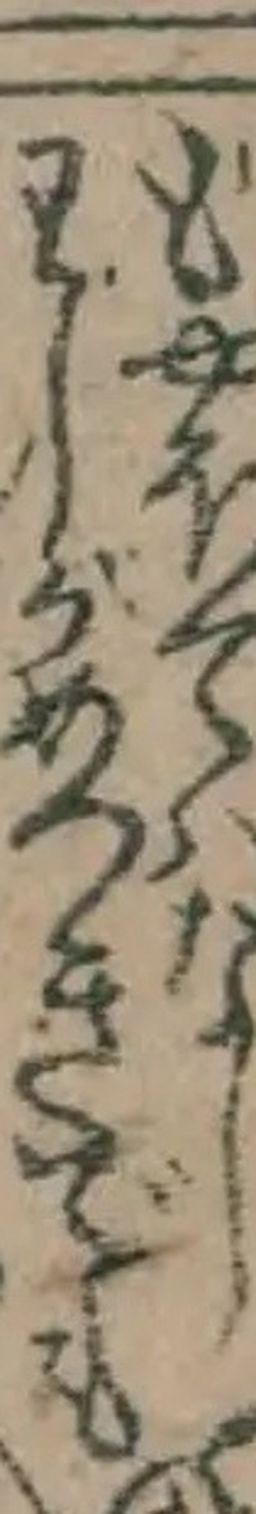わしがめつきでも
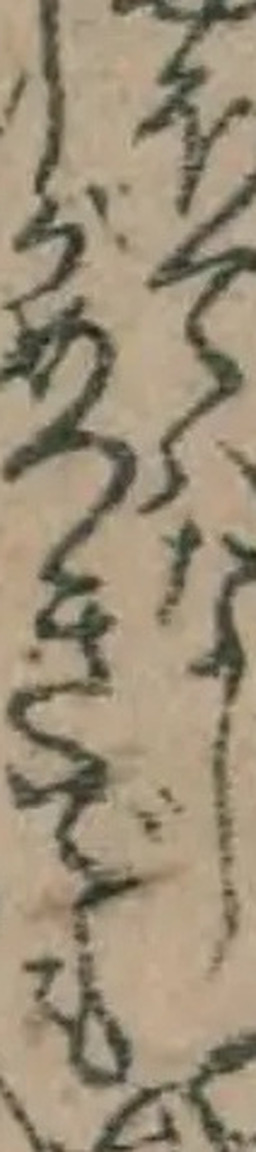わしがめつきでも
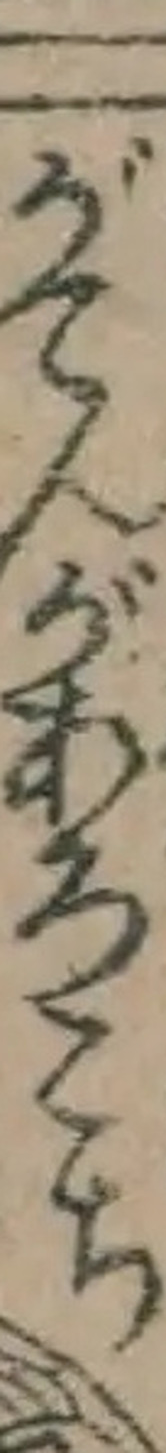がてんがあろこち
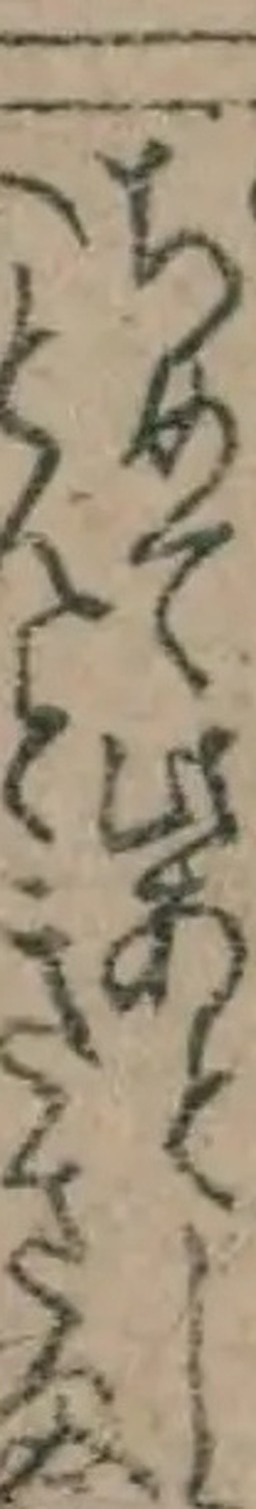はとんときさまに
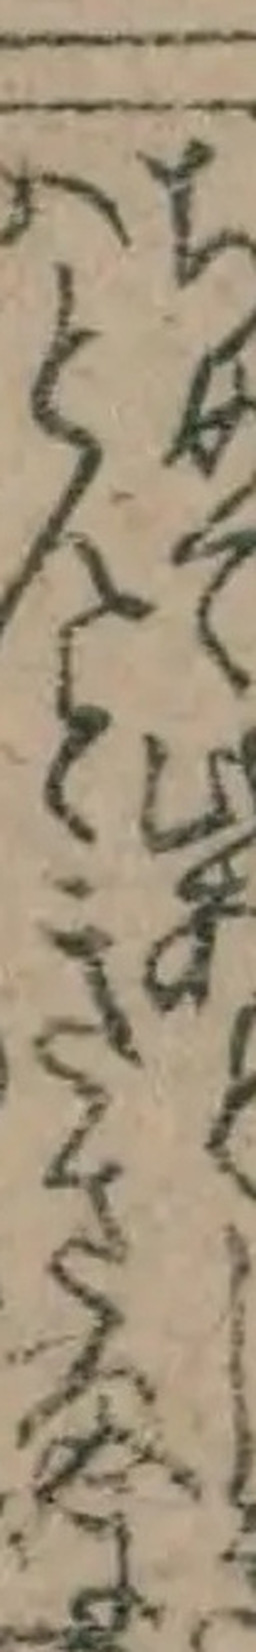はとんときさまに
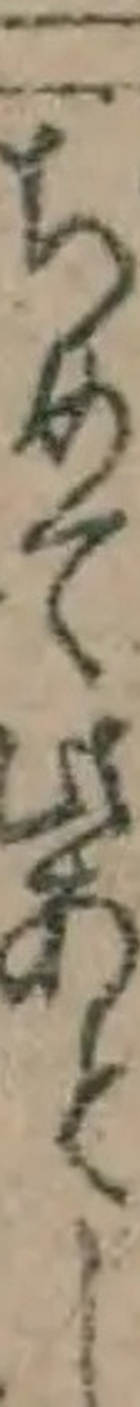ちめて此あとしき
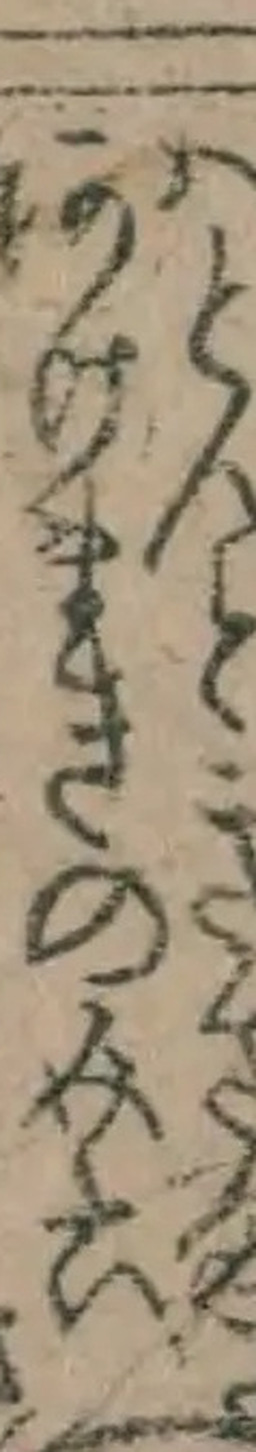あけまきの介六た
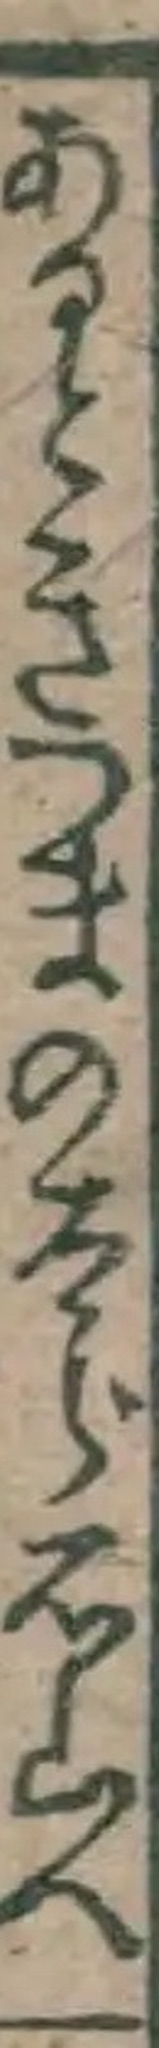あるときつまの太郎石山へ
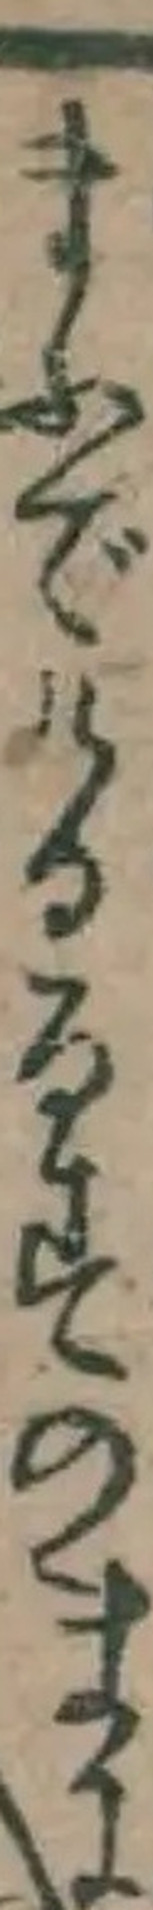まふでけるるすのまに
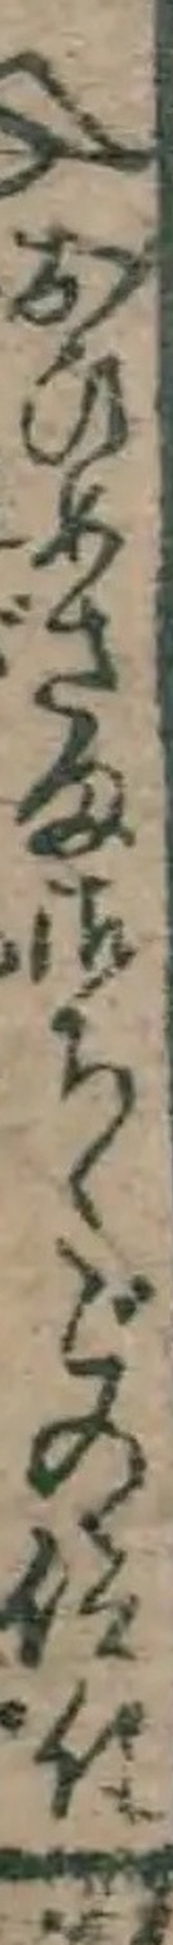おひめさま御ちちごの仰付
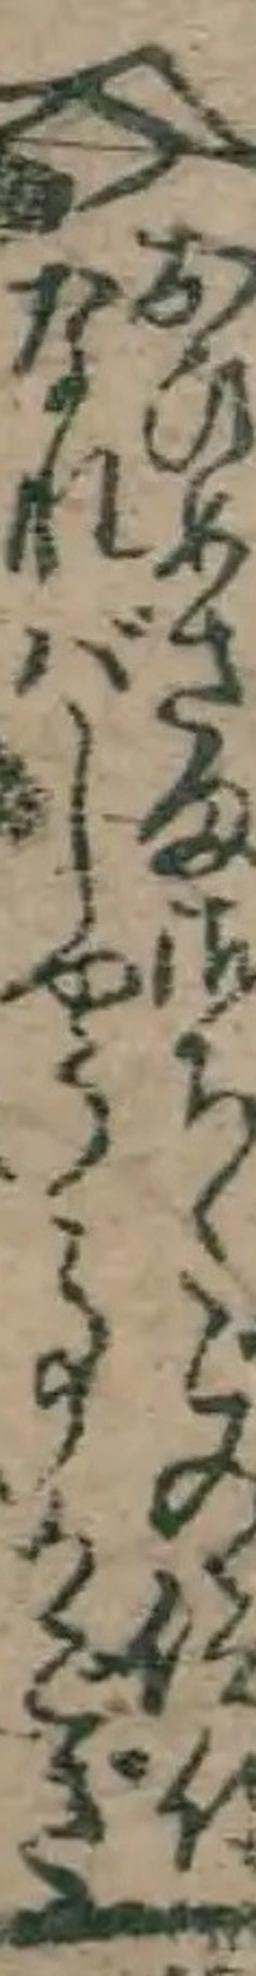なればしやう事かござ
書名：団十郎蓬芥伝
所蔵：国立国会図書館 National Diet Library, JAPAN
